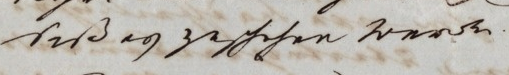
daß es geschehen werde.
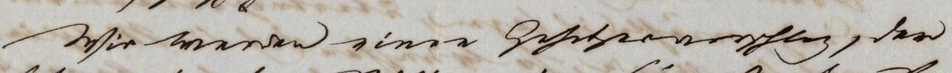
Wir werden einen Gesetzesvorschlag, der
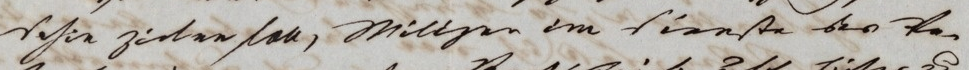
dahin zielen soll, Milizen im Dienste des Va-
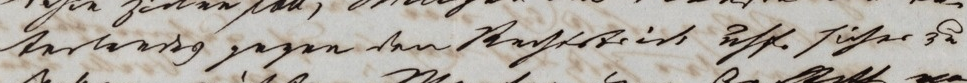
terlandes gegen den Rechtstrieb usf. sicher zu
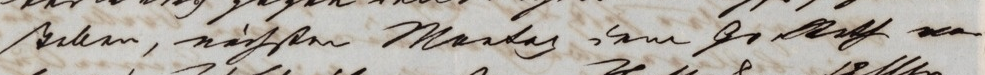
stellen, nächsten Montag dem Gr Rath vor-
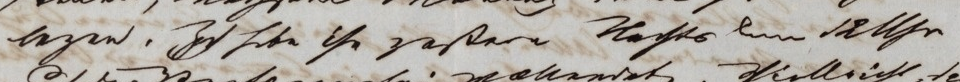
legen. Ich habe ihn gestern Nachts um 12 Uhr
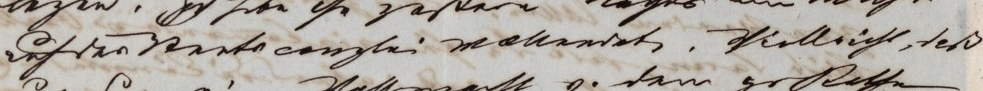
auf der Staatscanzlei vollendet. Vielleicht, daß
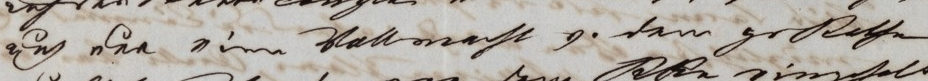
auch nur eine Vollmacht v. dem gr Rathe
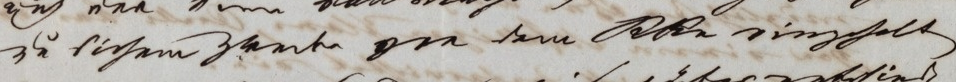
zu diesem Zwecke von dem RRe eingeholt
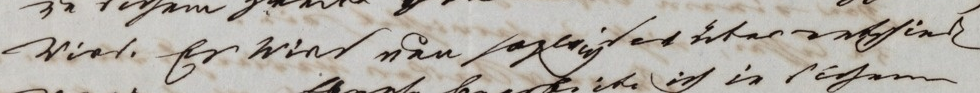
wird. Es wird nun sogleich darüber entschieden
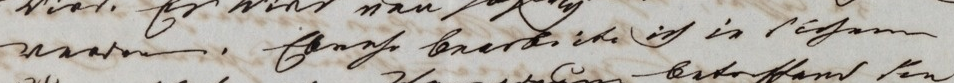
werden. Ebenso bearbeite ich in diesem
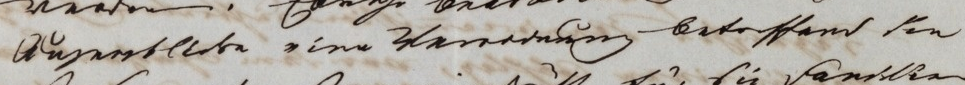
Augenblicke eine Verordnung betreffend die
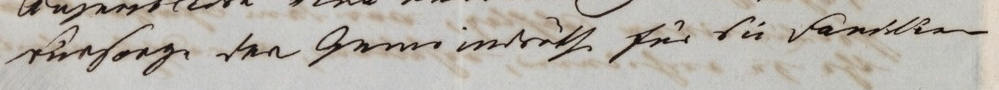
Fürsorge der Gemeindräthe für die Familien
